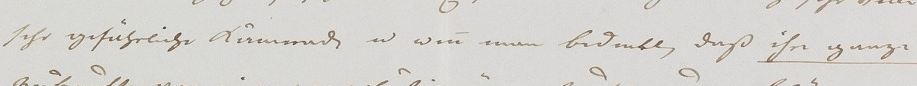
sehr gefährliche Kameraden u wenn man bedenkt, daß ihre ganze
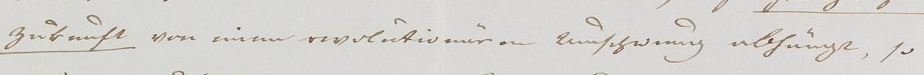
Zukunft von einem revolutionären Umschwung abhängt, so
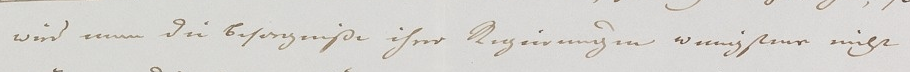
wird man die Besorgniße ihrer Regierungen wenigstens nicht
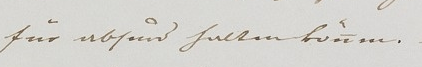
für absurd halten können. –
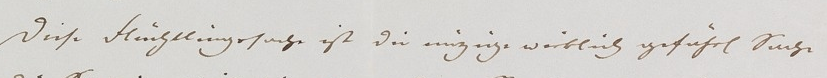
Diese Flüchtlingssache ist die einzige wirklich gefährliche Sache
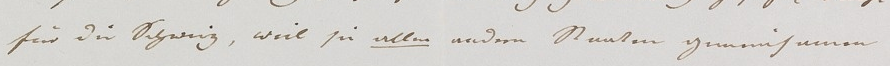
für die Schweiz, weil sie allen andern Staaten gemeinsamen
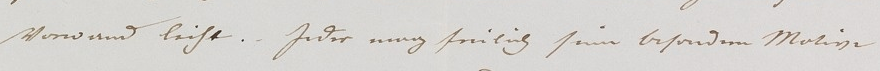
Vorwand leiht. – Jeder mag freilich seine besondern Motive
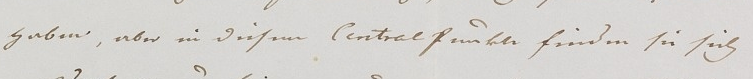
haben, aber in diesem Central Punkte finden sie sich. –
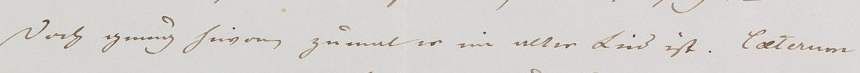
Doch genug hievon, zumal es ein altes Lied ist. Cæterum
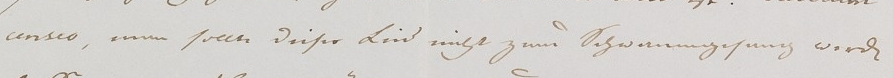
censeo, man sollte dieses Lied nicht zum Schwanengesang werden
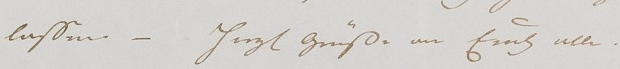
lassen. – Herzliche Grüße an Euch alle.
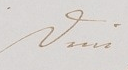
Dein
